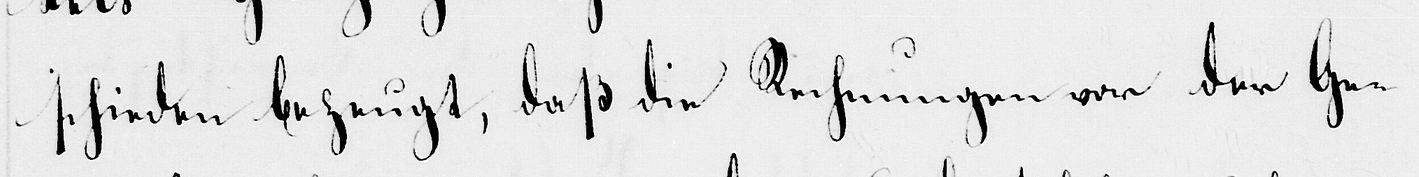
schieden bezeugt, daß die Rechnungen vor der Ge¬
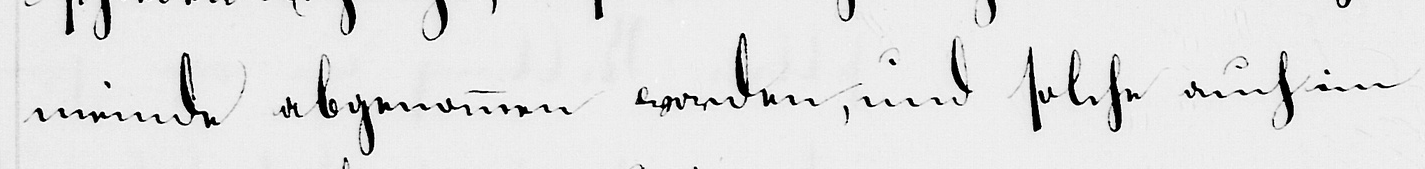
meinde abgenommen worden, und solche auch im
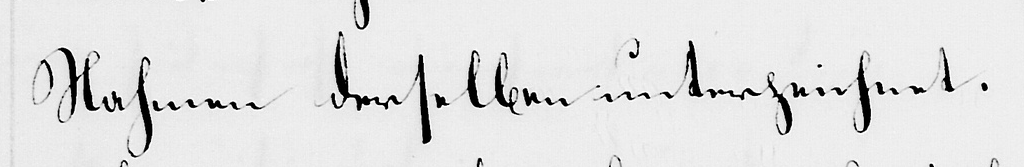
Nahmen derselben unterzeichnet.
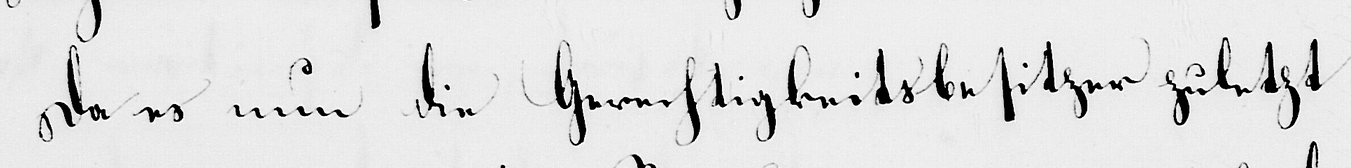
Da es nun die Gerechtigkeitsbesitzer zuletzt
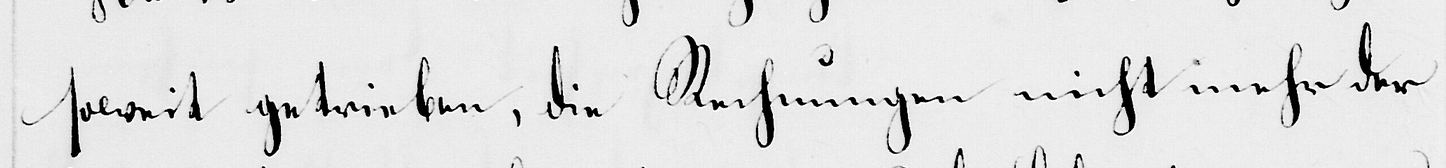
soweit getrieben, die Rechnungen nicht mehr der
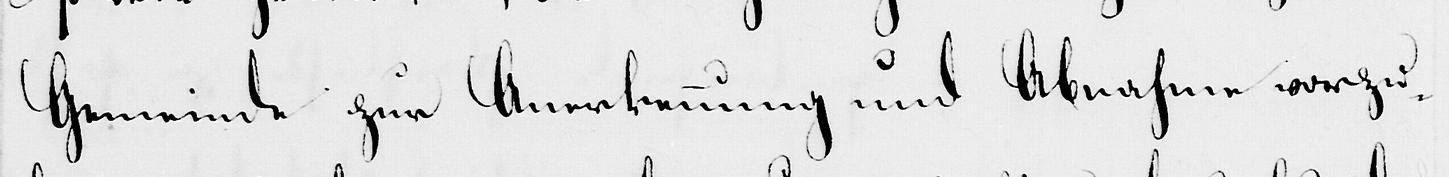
Gemeinde zur Anerkennung und Abnahme vorzu¬
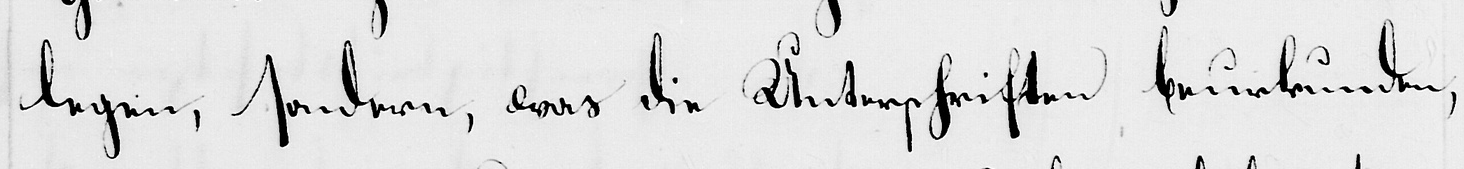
legen, sondern, was die Unterschriften beurkunden,
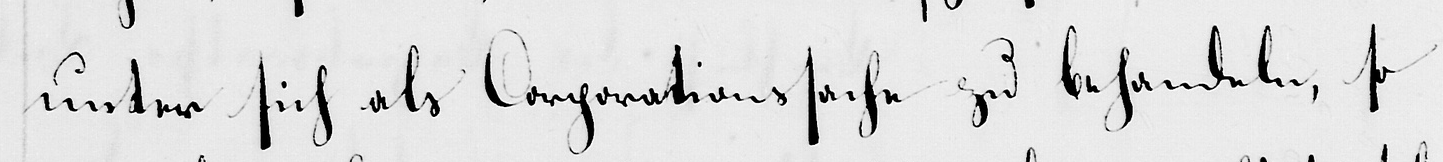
unter sich als Corporationssache zu behandeln, so
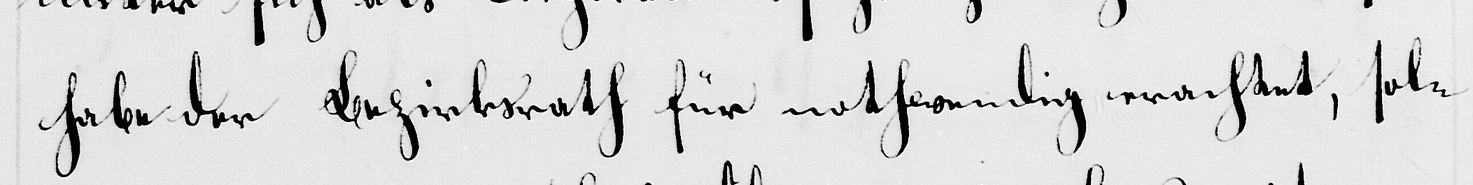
habe der Bezirksrath für nothwendig erachtet, sol¬
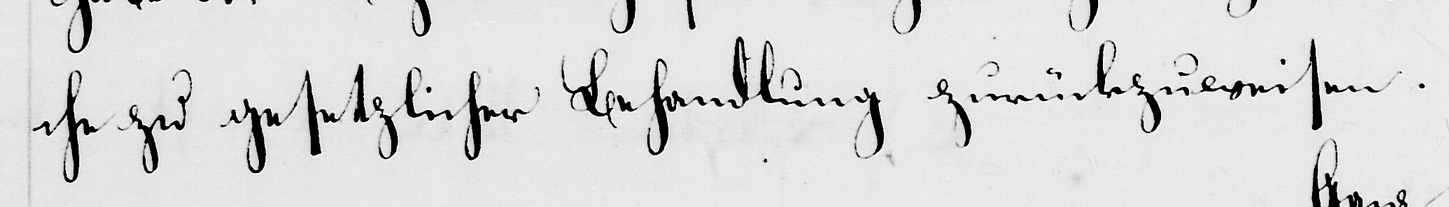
che zu gesetzlicher Behandlung zurückzuweisen.
